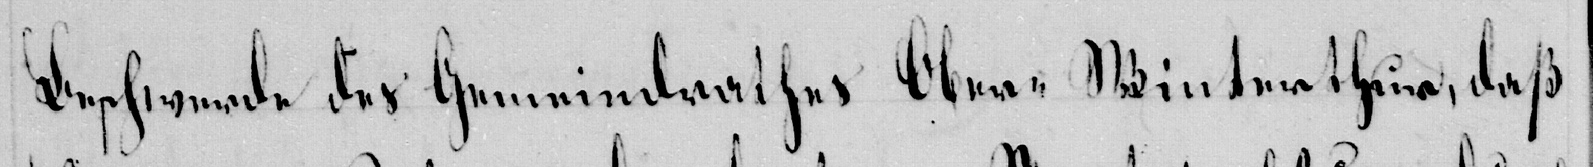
Beschwerde des Gemeindrathes Ober-Winterthur, daß
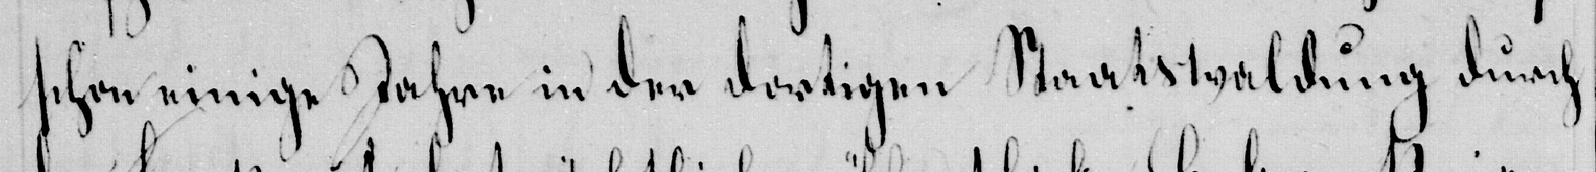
schon einige Jahre in der dortigen Staatswaldung durch
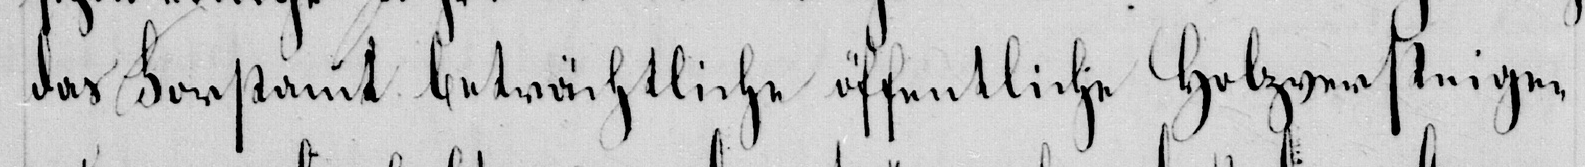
das Forstamt beträchtliche öffentliche Holzversteige¬
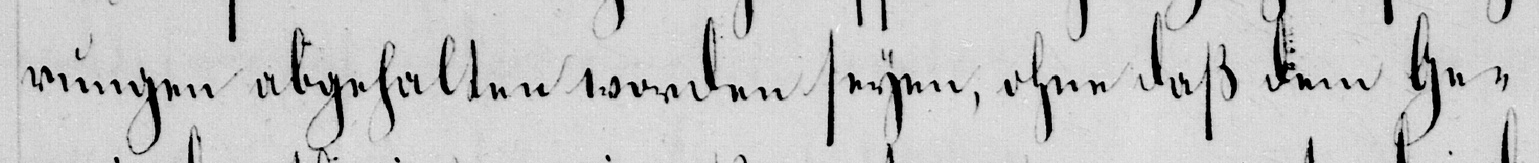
rungen abgehalten worden seyen, ohne daß dem Ge¬
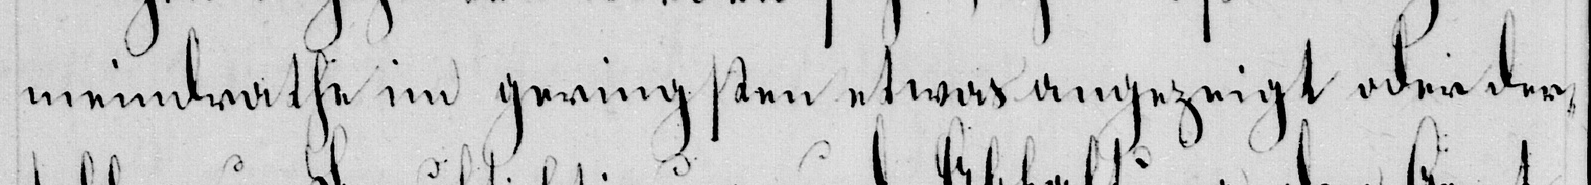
meindrathe im geringsten etwas angezeigt oder der¬
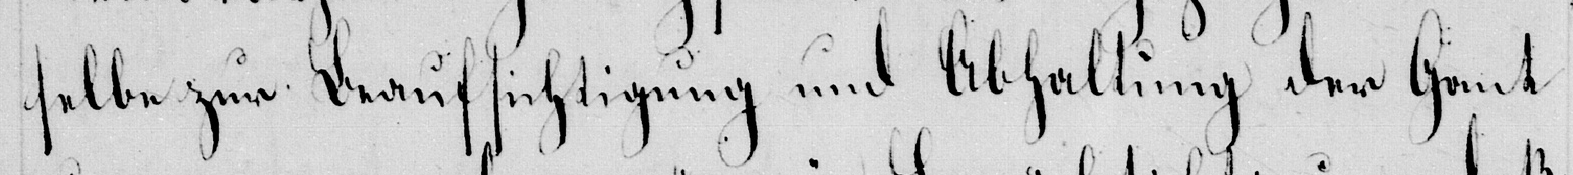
selbe zur Beaufsichtigung und Abhaltung der Gant
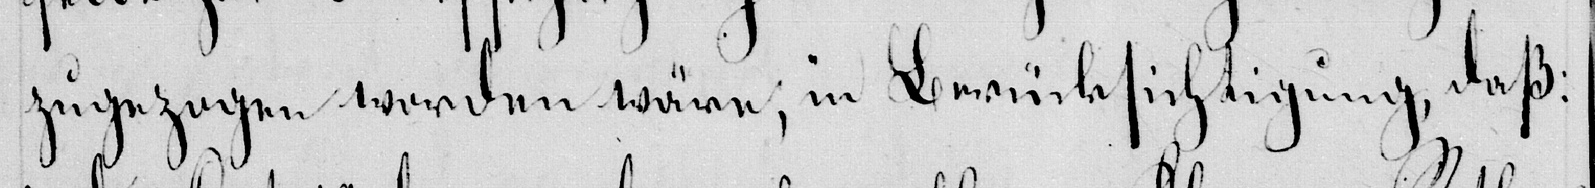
zugezogen worden wäre, in Berücksichtigung, daß:
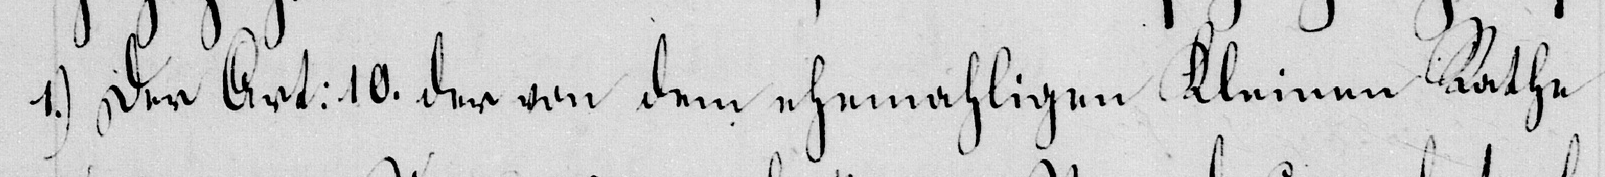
1.) der Art: 10. der von dem ehemahligen Kleinen Rathe
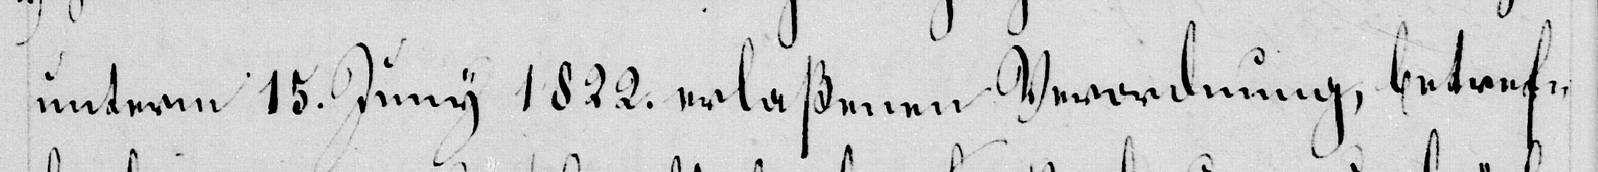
unterm 15. Juny 1822. erlaßenen Verordnung, betref¬
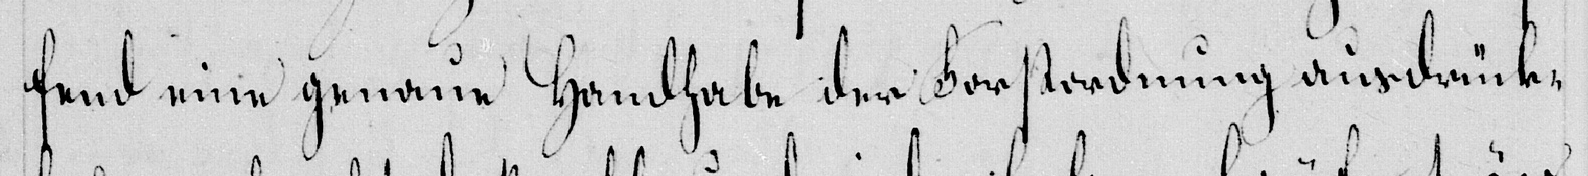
fend eine genaue Handhabe der Forstordnung ausdrück¬
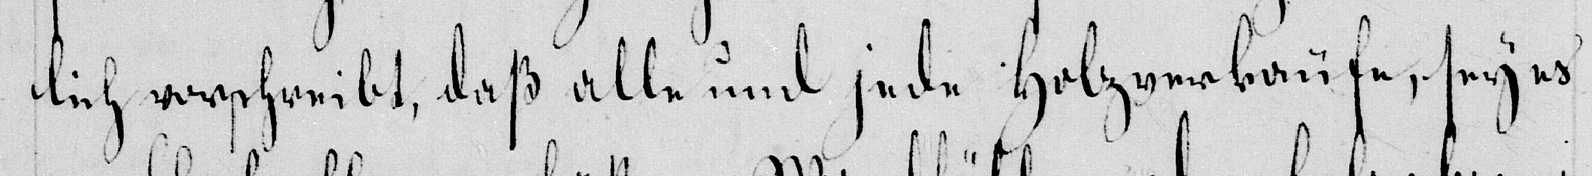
lich vorschreibt, daß alle und jede Holzverkäufe, sey es
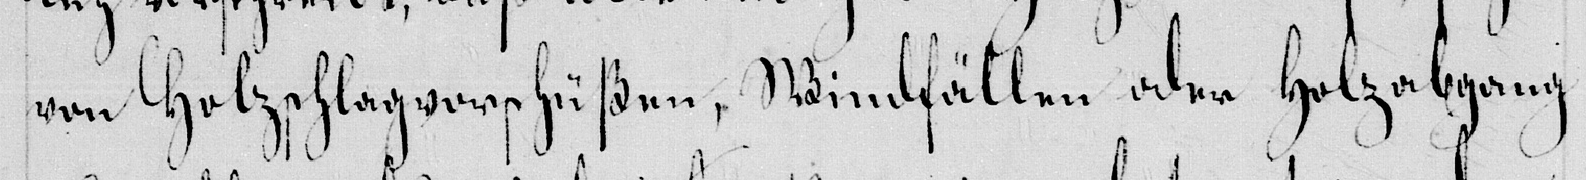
von Holzschlagvorschüßen, Windfällen oder Holzabgang
